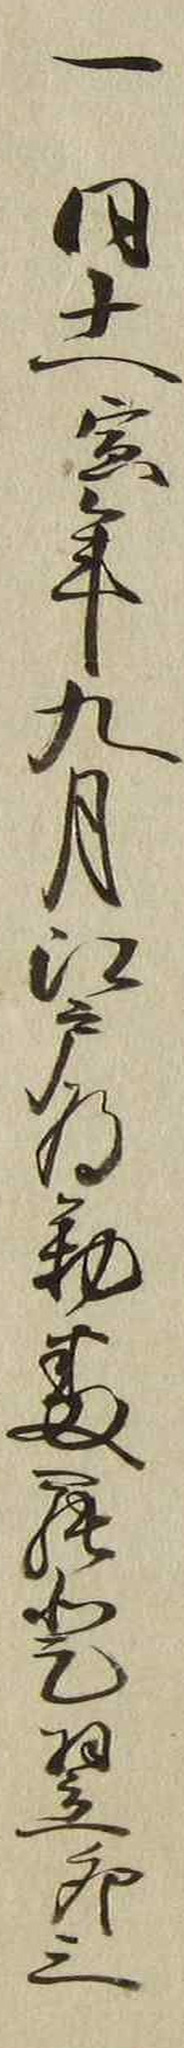一同十一寅年九月江戸為勤番罷登翌卯三
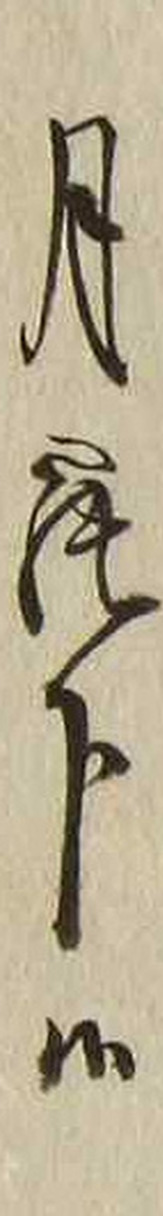月罷下候
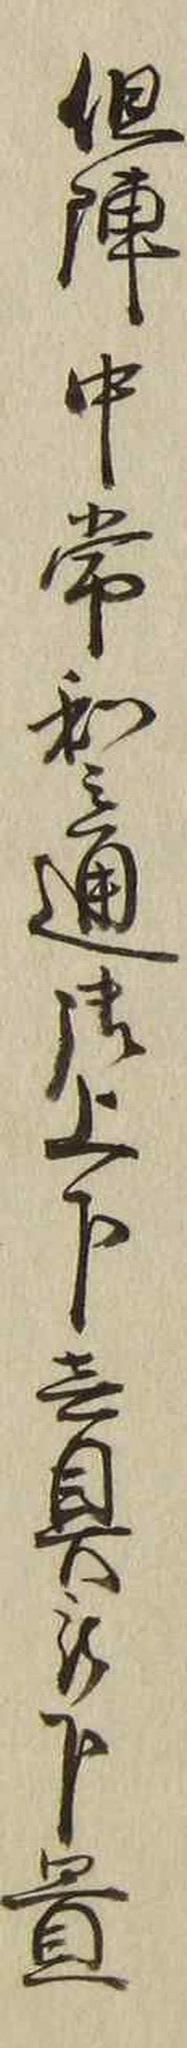但陣中常和之通御上下壱具被下置

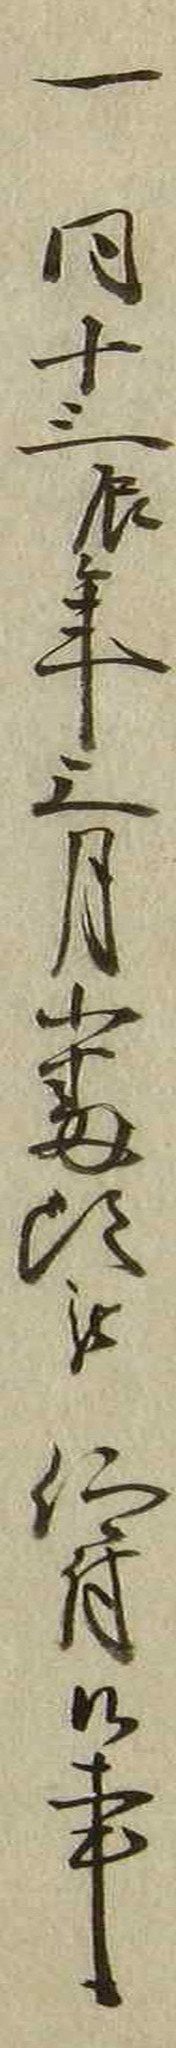一同十三辰年三月小番頭被仰付候事
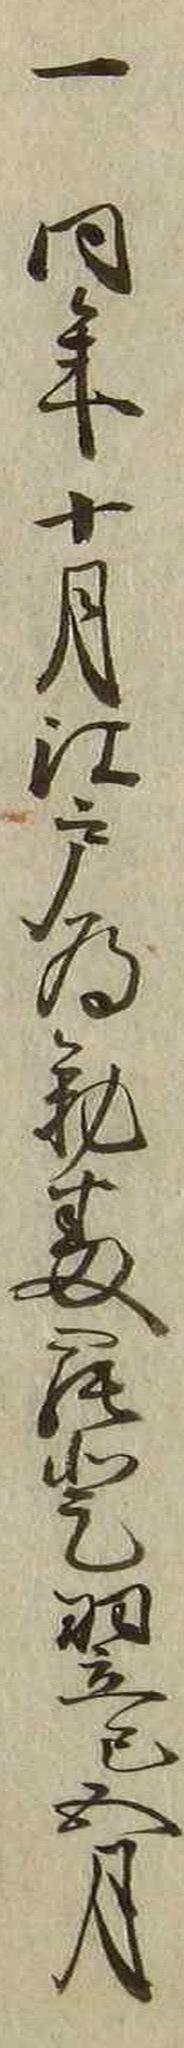一同年十月江戸為勤番罷登翌巳五月
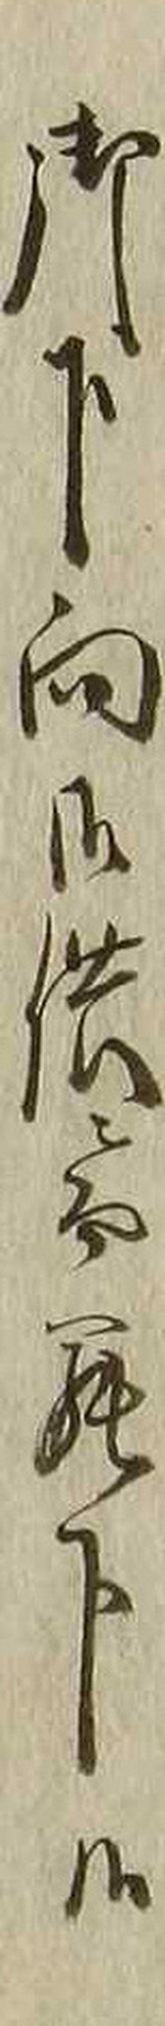御下向御供ニ而罷下候
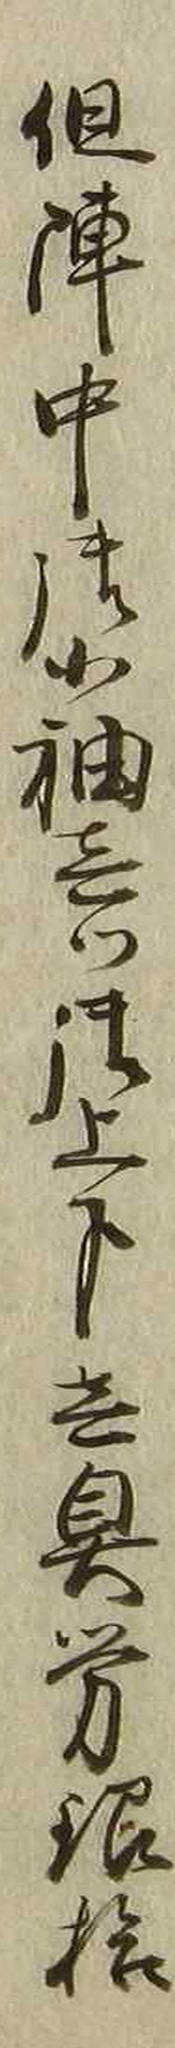但陣中御小袖壱ツ御上下壱具労銀拾
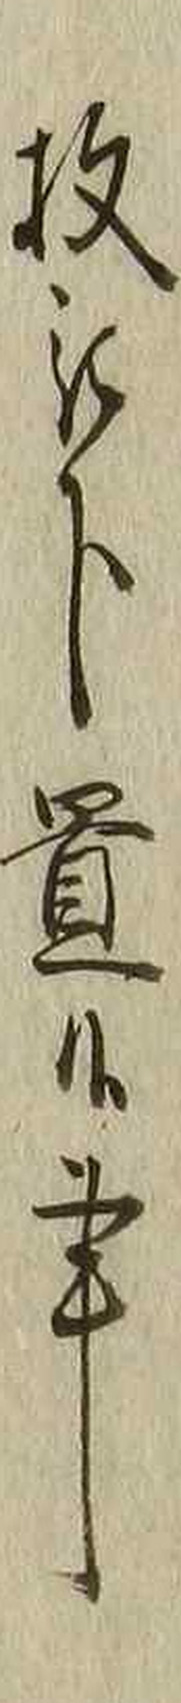枚被下置候事
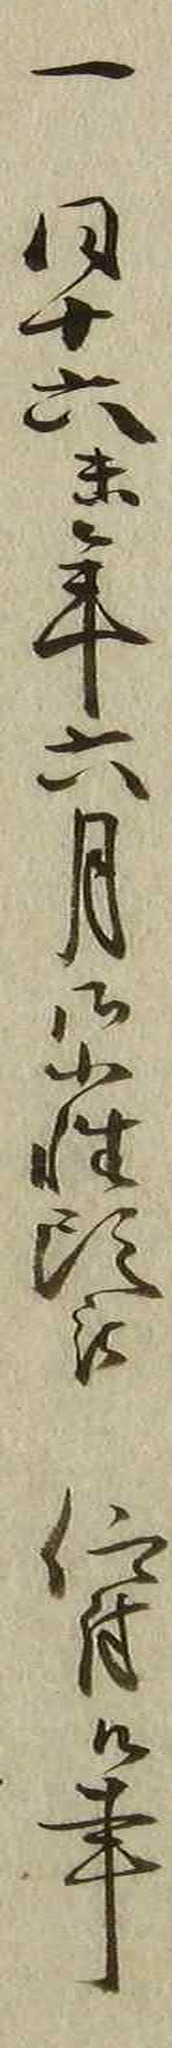一同十六未年六月御小姓頭被仰付候事
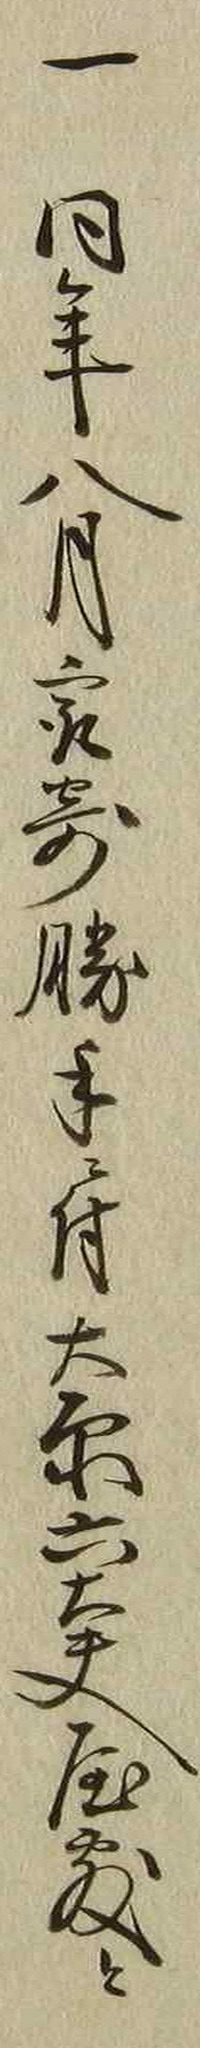一同年八月最寄勝手ニ付大原六太夫屋敷と
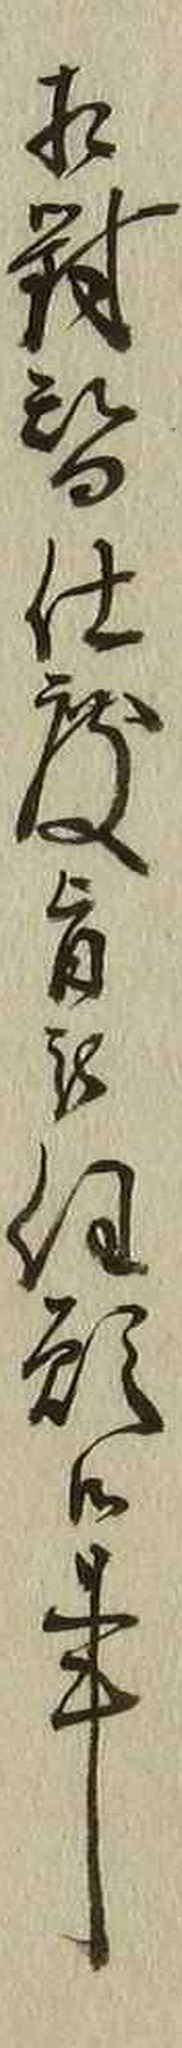相対替仕度旨被伺願候事
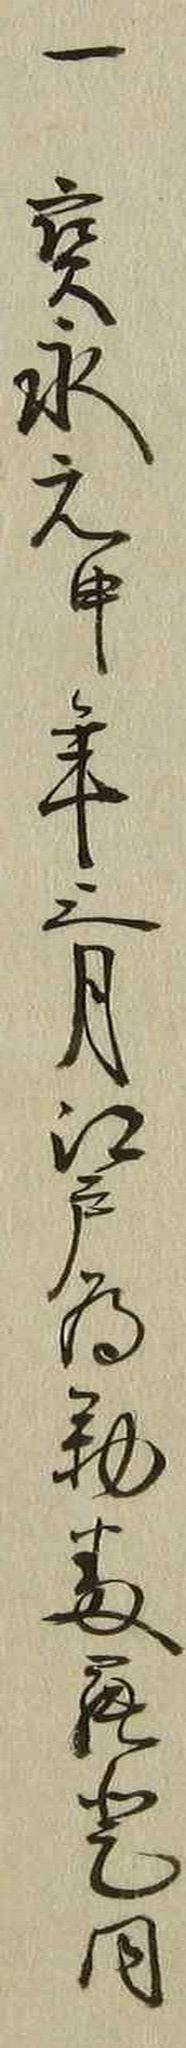一宝永元申年三月江戸為勤番罷登同
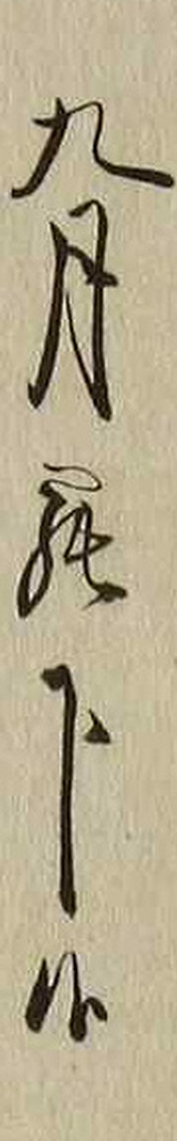九月罷下候
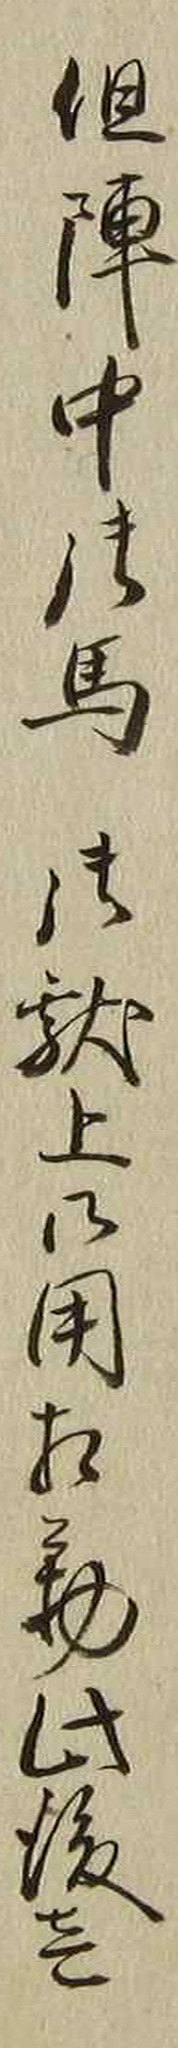但陣中御馬御献上御用相勤此後壱
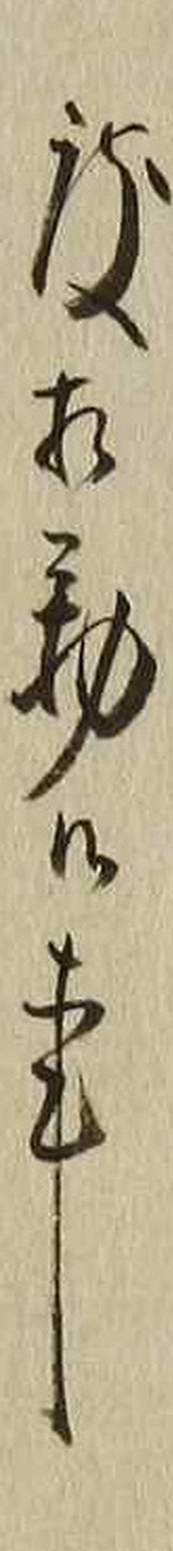度相勤候事
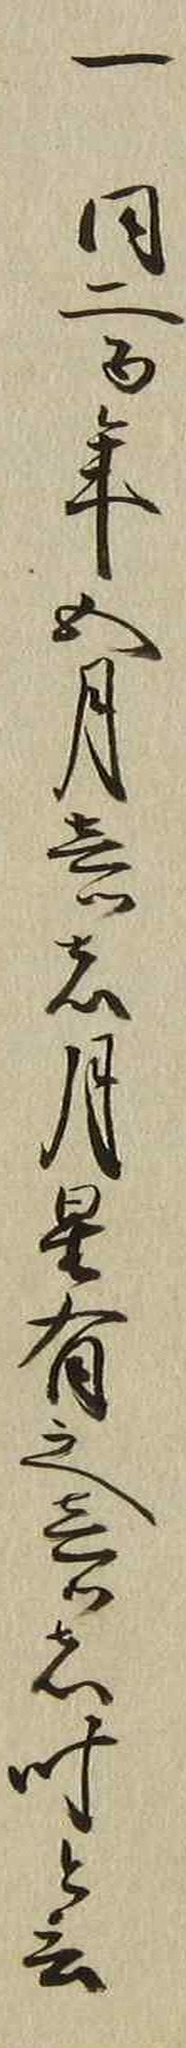一同二酉年五月壱ツ者月星有之壱ツ者叶と言
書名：諸士系譜　巻之65　ち之部1
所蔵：会津若松市立会津図書館
